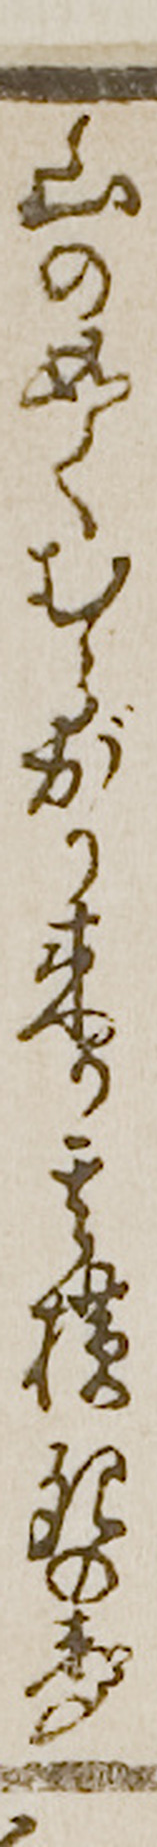山の如くむらがり来り其横死の声
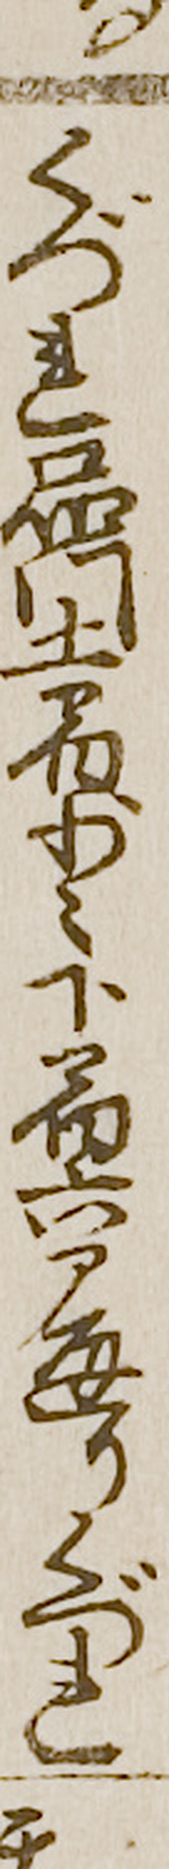くづれ品川土宿少々下宿六部通りくづれ
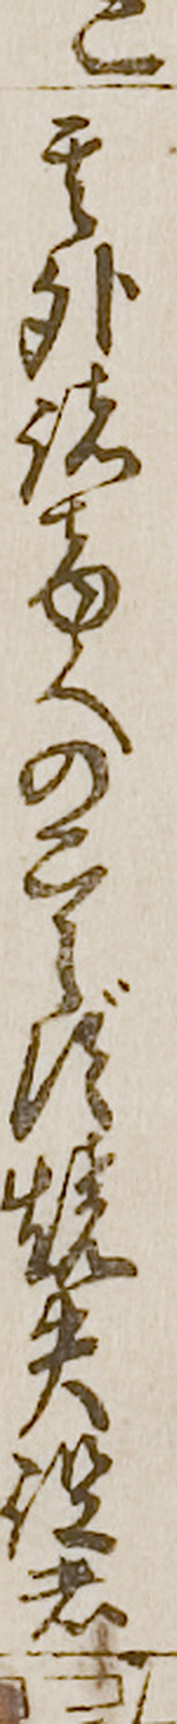其外諸商人のこらず焼失役者
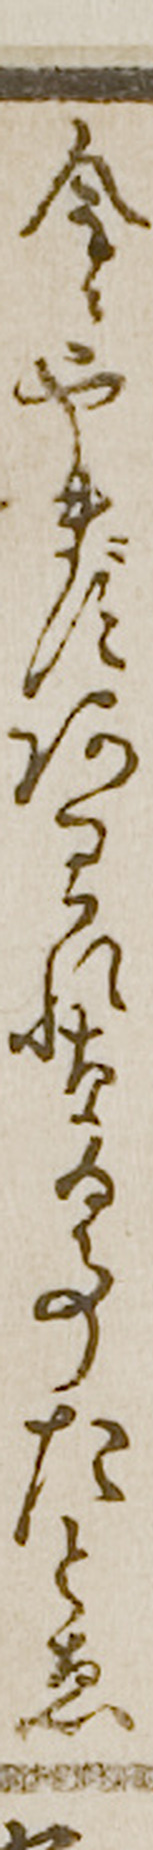今にやまずあわれなる事たとゑ
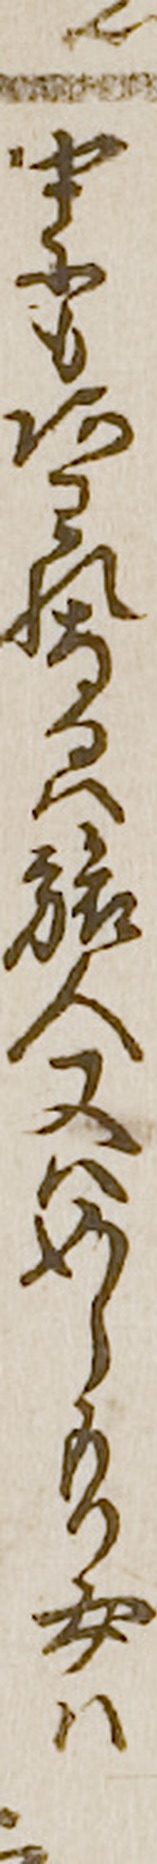中にもあわれなるは旅人又はめしもり女は
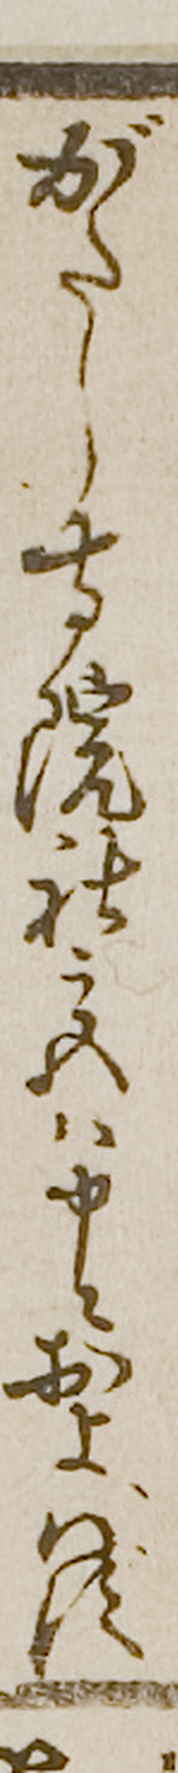がたし寺院社宮は申におよはす
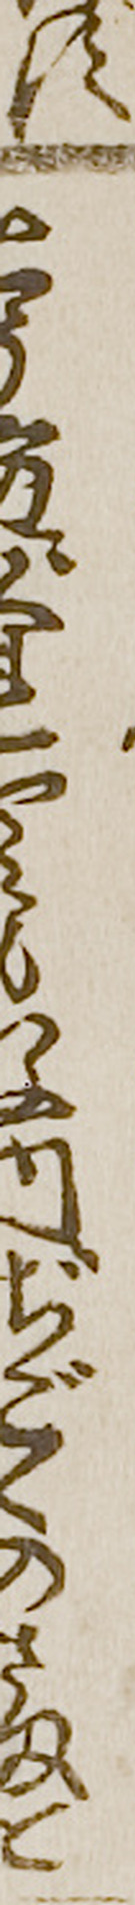とう方にくれやゝもいふ内ぢごくのさまを
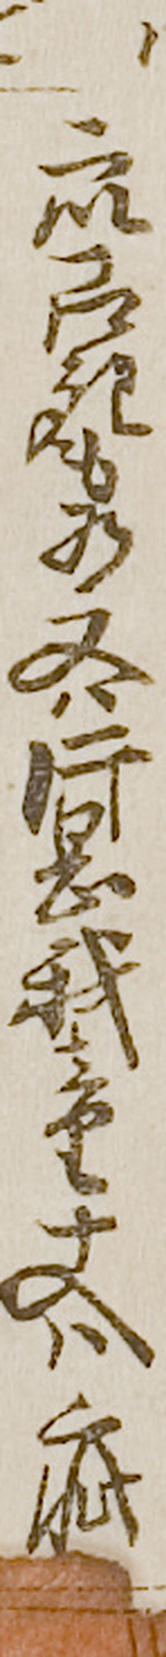衆即死も有又は片岡我童丈は疵
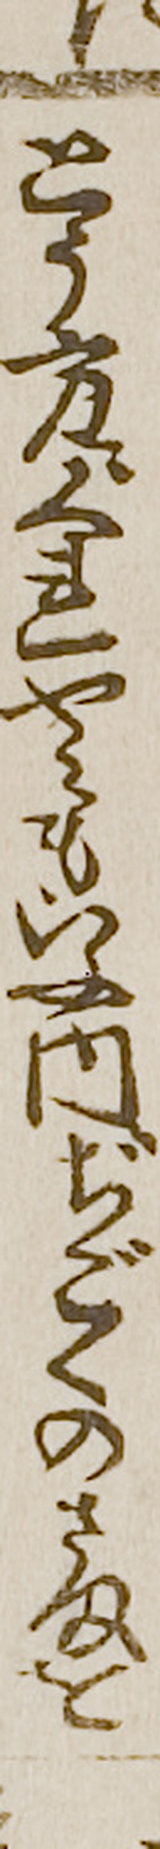とう方にくれやゝもいふ内ぢごくのさまを
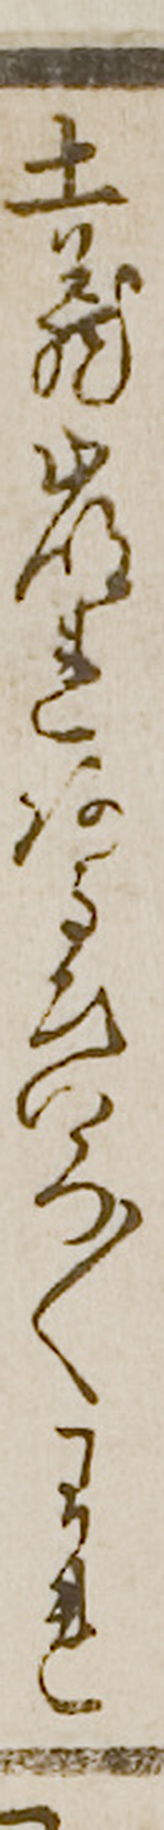土蔵崩れあるはいろ〳〵われ
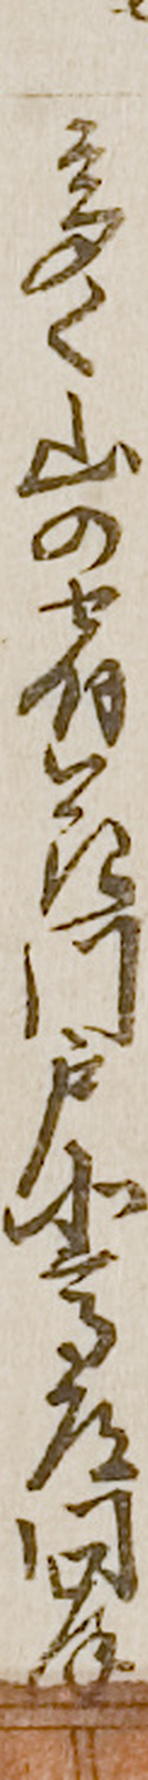多く山の宿花川戸北馬道川岸
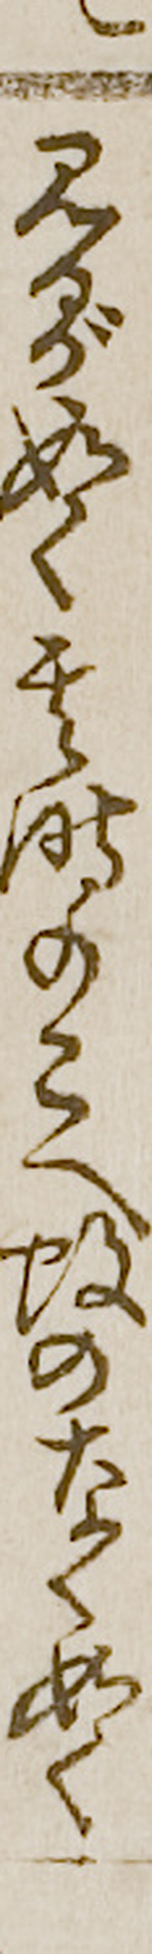見るが如く其時のこへ蚊のなく如く
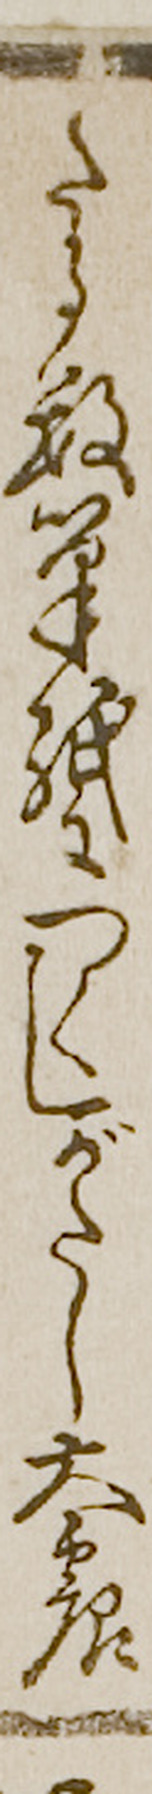たる数筆紙につくしがたし大震
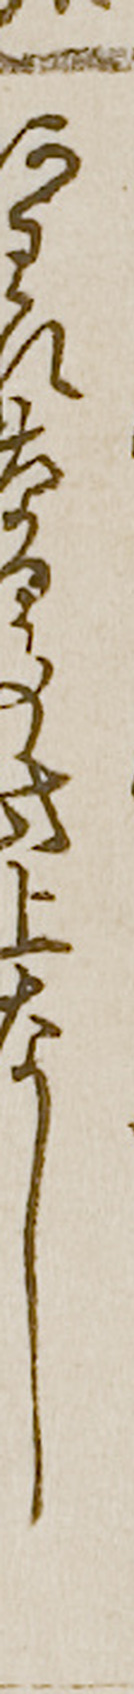あわれなる事此上なし
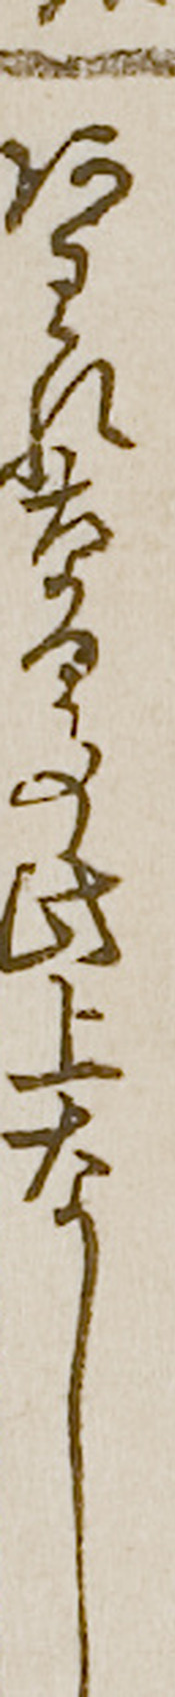あわれなる事此上なし
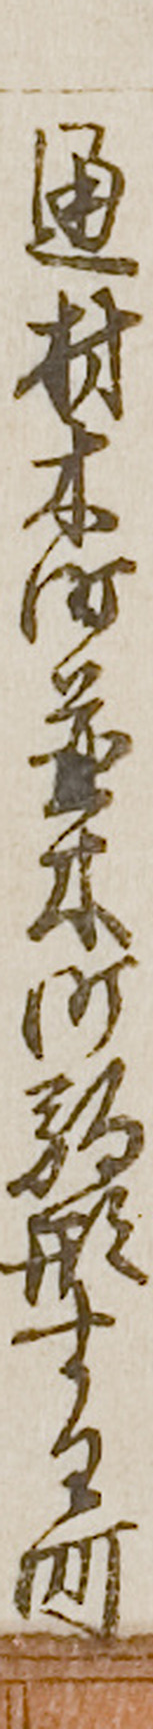通材木町並木町駒形すわ町
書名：東都珍事実録咄
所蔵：東京大学総合図書館 General Library in the University of Tokyo, JAPAN
